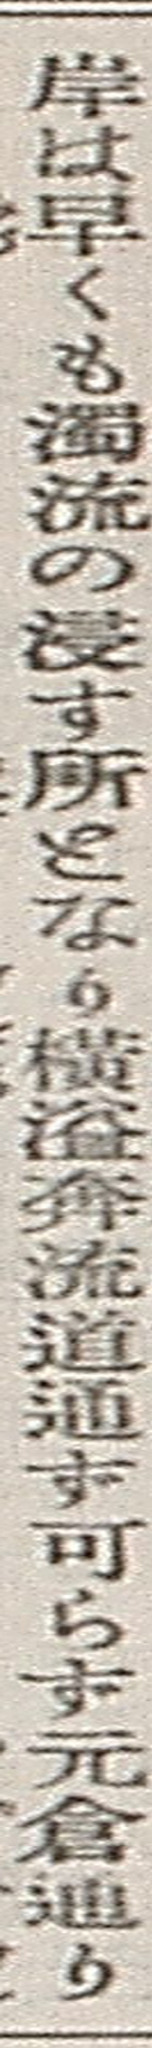岸は早くも濁流の浸す所となり横溢奔流道通ず可らず元倉通り
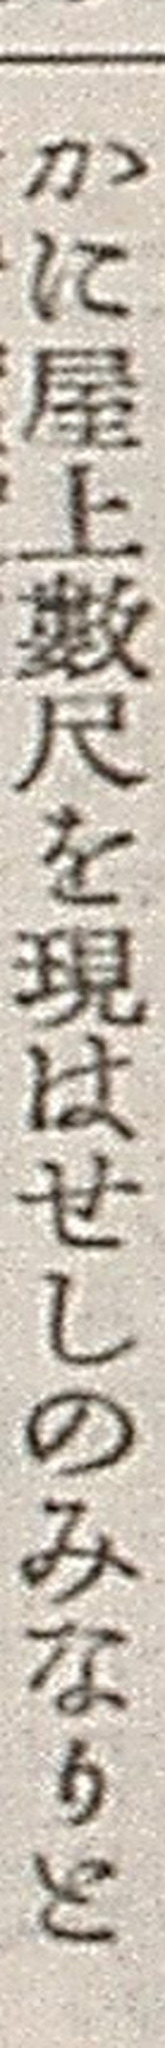かに屋上数尺を現はせしのみなりと
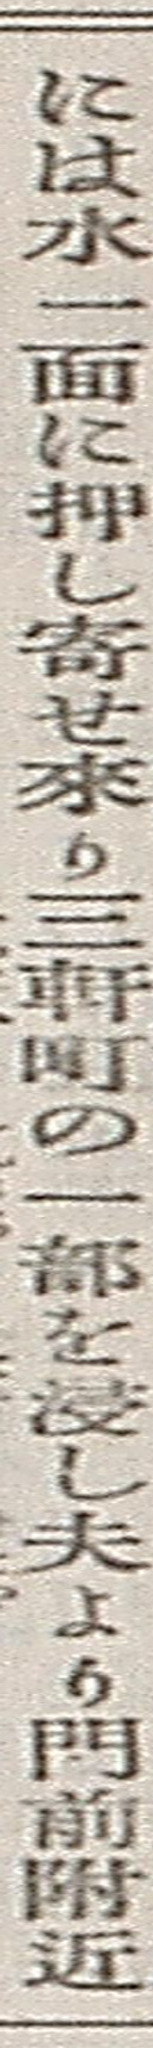には水一面に押し寄せ来り三軒町の一部を侵し夫より門前附近
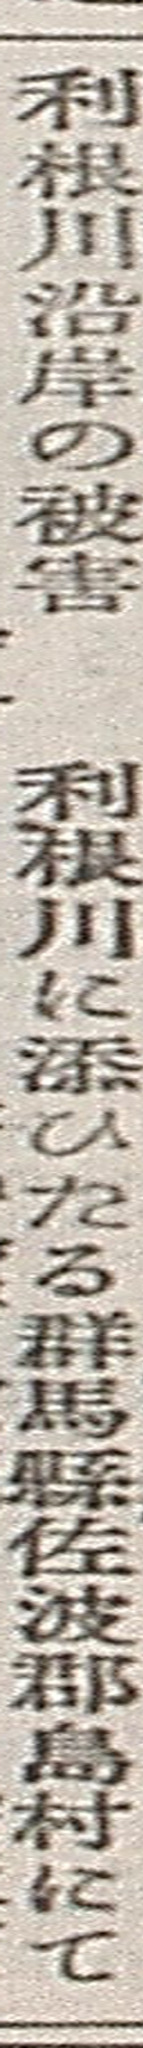利根川沿岸の被害利根川に沿ひたる群馬県佐波郡島村にて
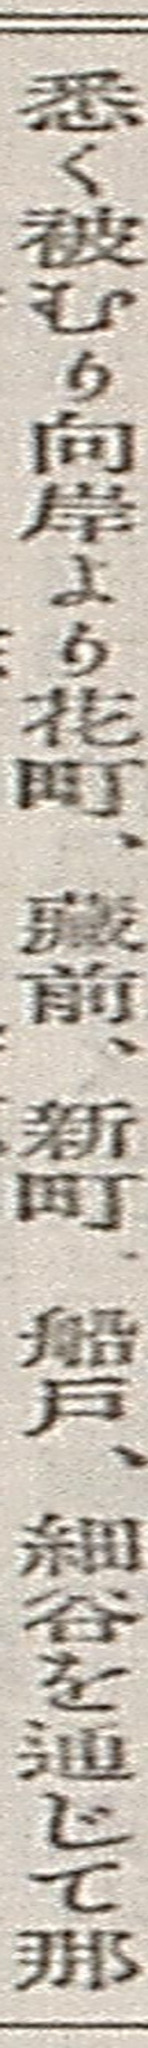悉く被むり向岸より花町、蔵前、新町、船戸、細谷を通じて那
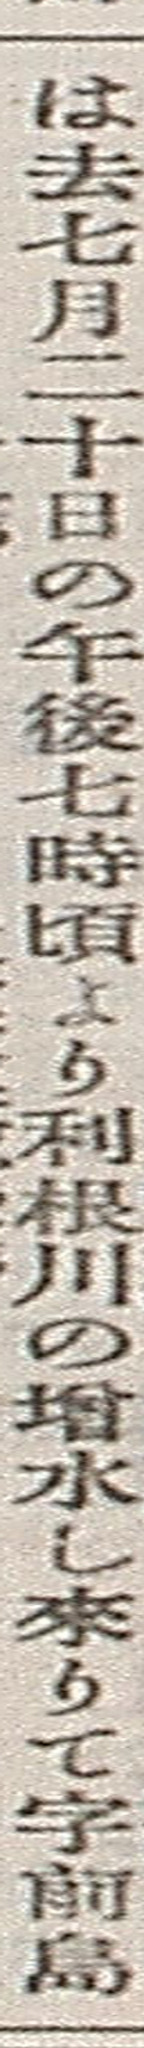は去七月二十日の午後七時頃より利根川の増水し来りて字前島
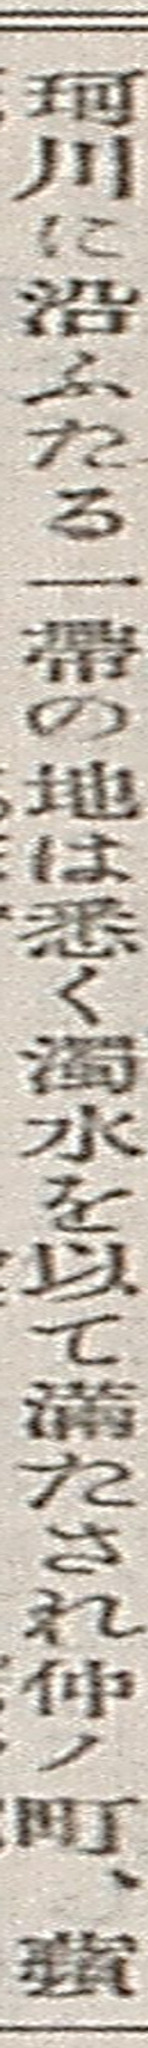珂川の沿ふたる一帯の地は悉く濁水を以て満たされ仲ノ町、
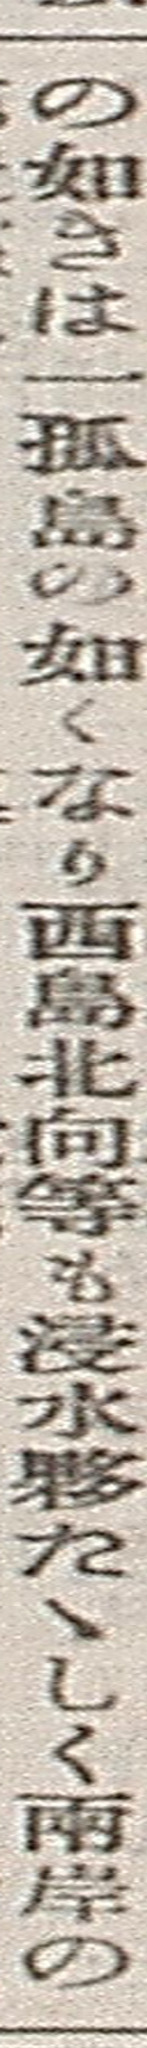の如きは一孤島の如くなり西島北向等も浸水夥たゝしく両岸の
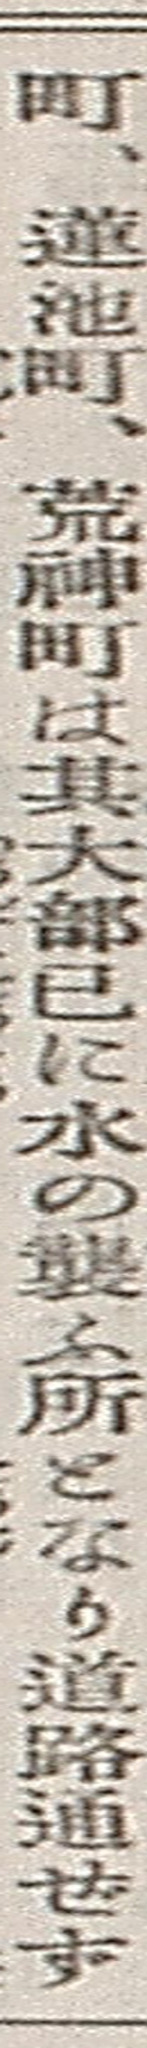町、蓮池町、荒神町は其大部已に水の襲ふ所となり道路通ぜず
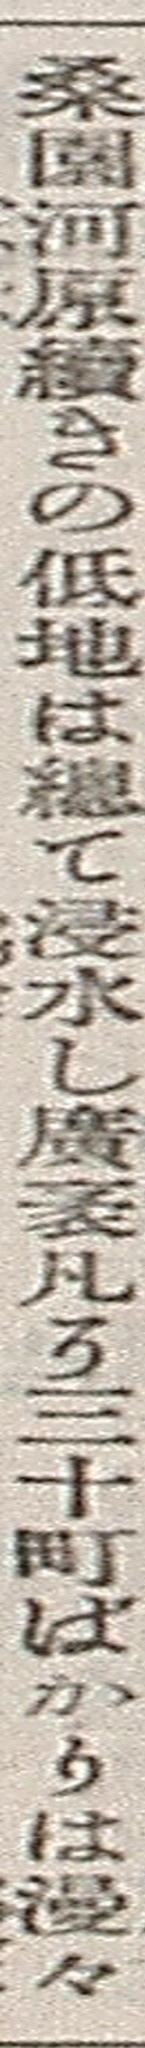桑園河原続きの低地は総て浸水し広袤凡そ三十町ばかりは漫々
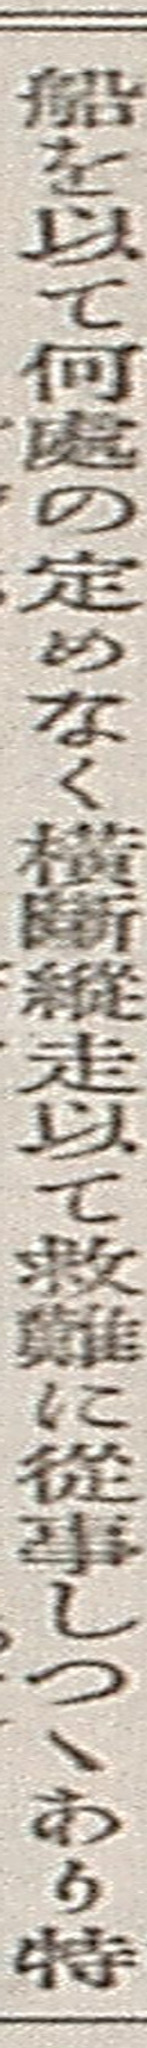船を以て何処の定めなく横断縦走以て救難に従事しつゝあり殊
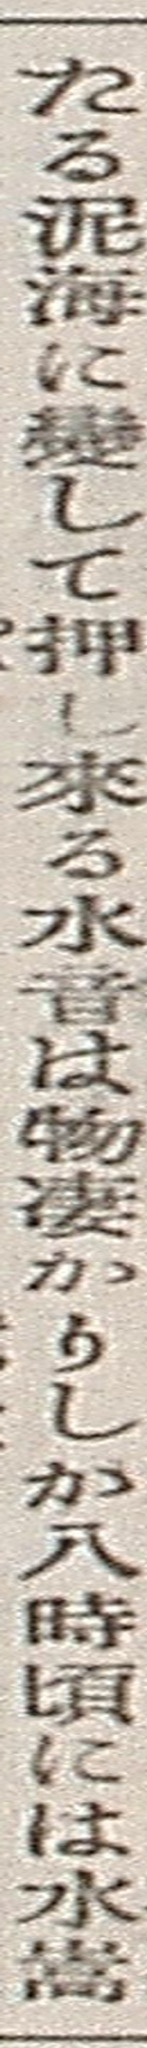たる泥海に変じて押し来る水音は物凄かりしか八時頃には水嵩
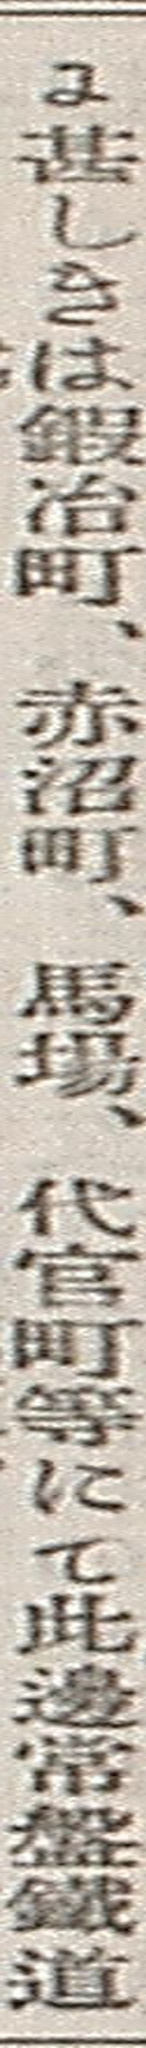に甚しきは鍛冶町、赤沼町、馬場、代官町等にて此辺常盤鉄道
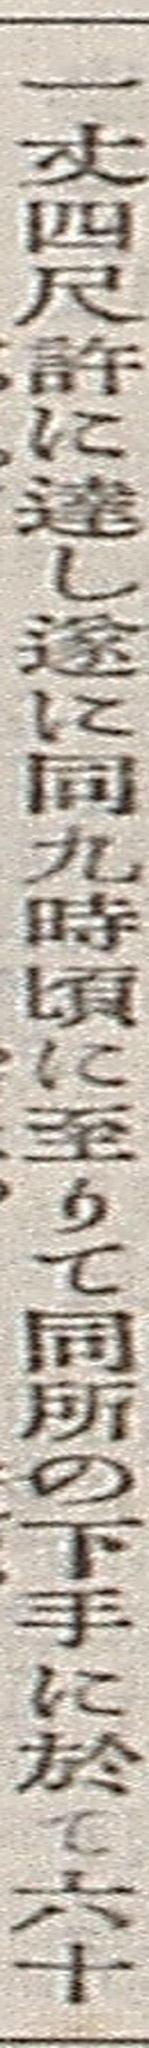一丈四尺許に達し遂に同九時頃に至りて同所の下手に於て六十
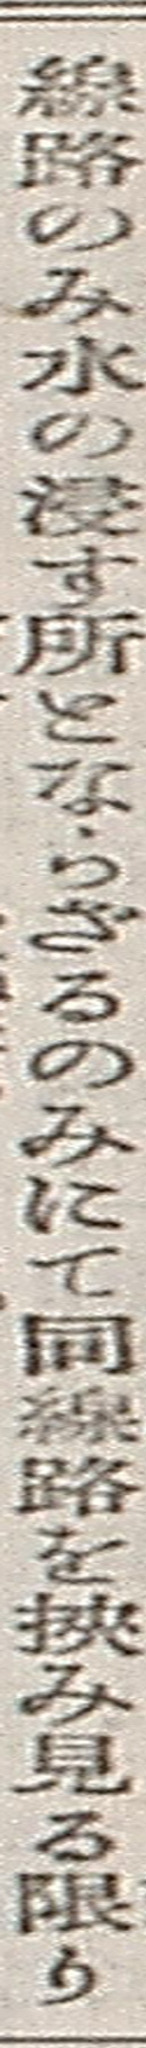線路のみ水の侵す所とならざるのみにて同線路を挟み見る限り
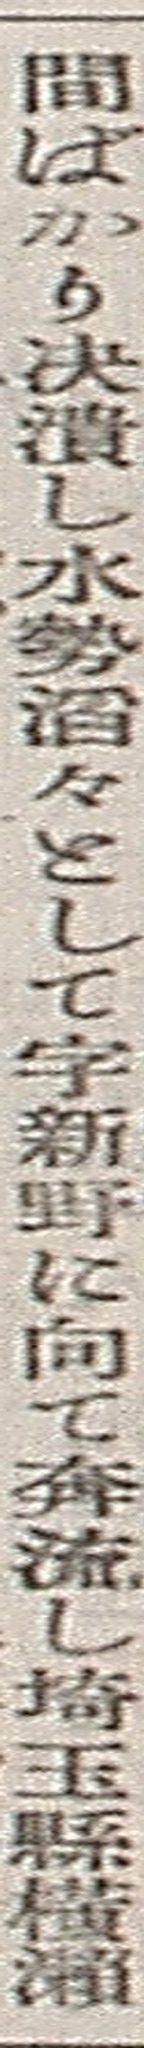間ばかり决潰し水勢滔々として字新野に向て奔流し埼玉県横瀬
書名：風俗畫報臨時増刊第百二十八號　洪水被害録（下）
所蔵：東京大学地震研究所図書室 Earthquake Research Institute Library, The University of Tokyo, JAPAN
